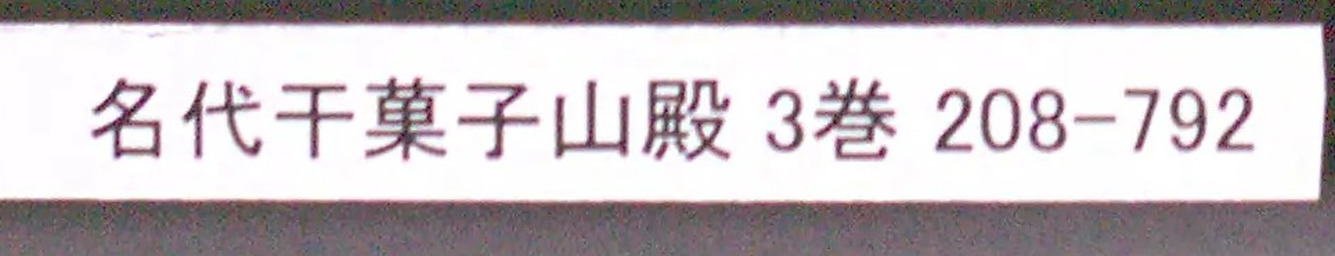名代干菓子山殿
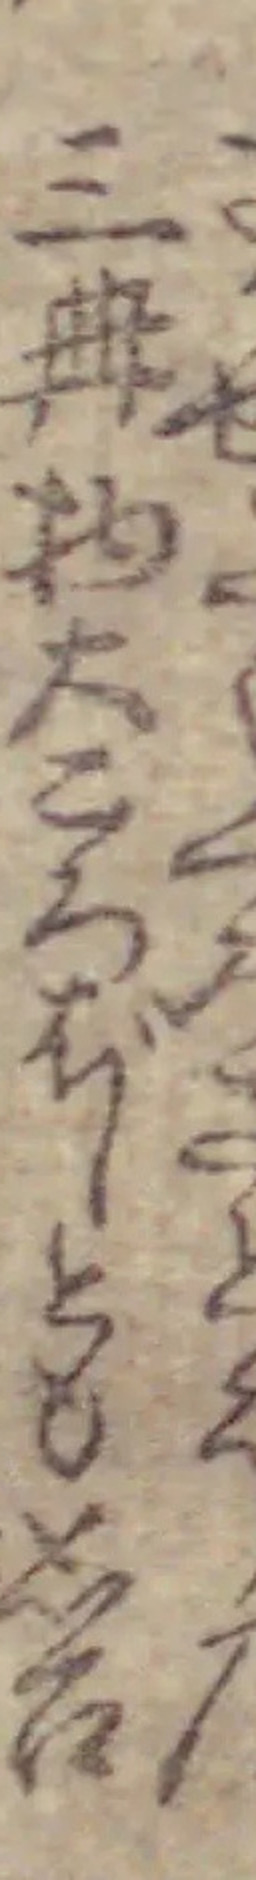三冊物大ころばしとも思召
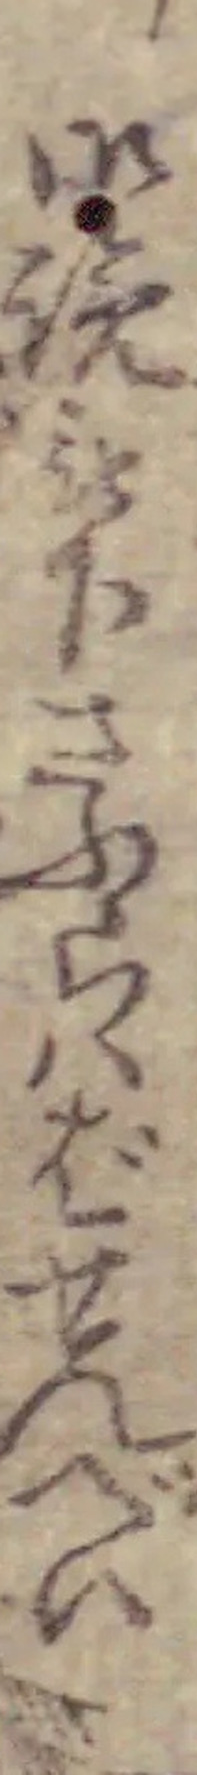御読被下さふらはばせんべい
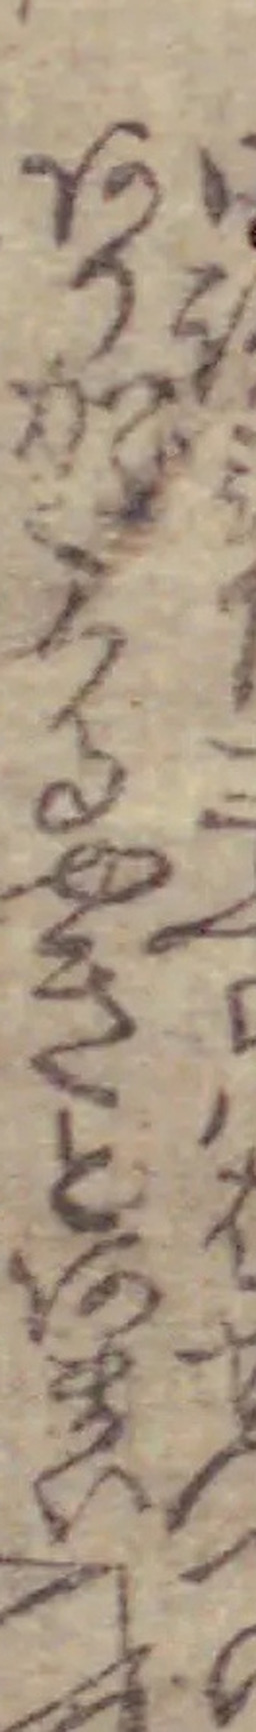ありがたかるやきとあまい
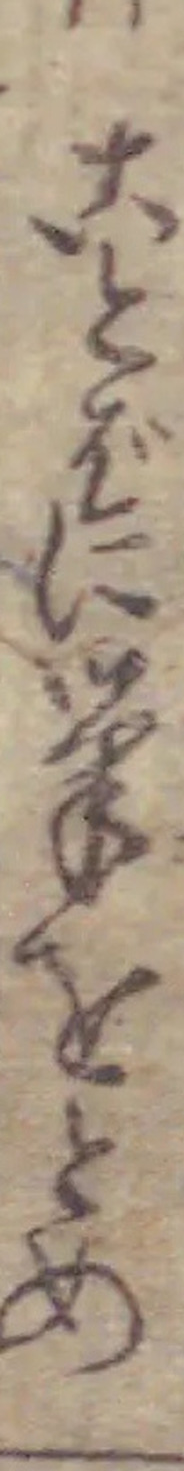ことばに筆をとめ

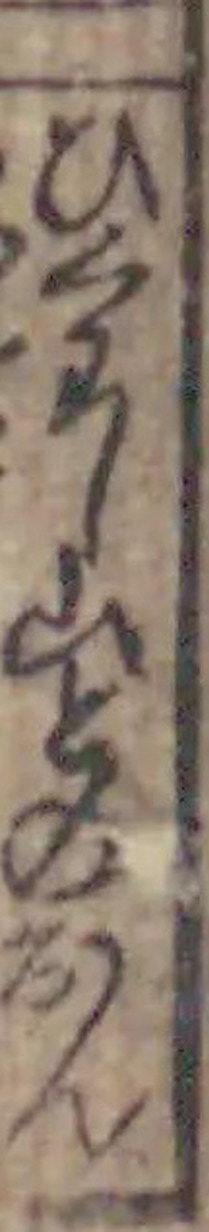ひくわし山とのおん
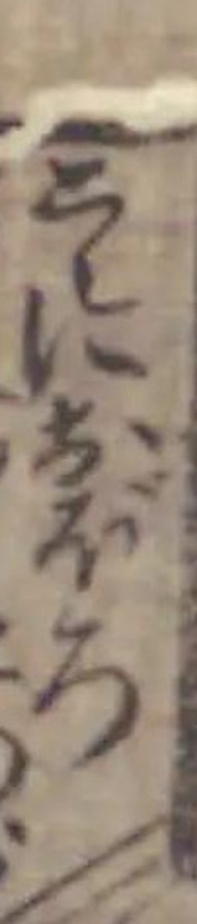こゝにおぼろ
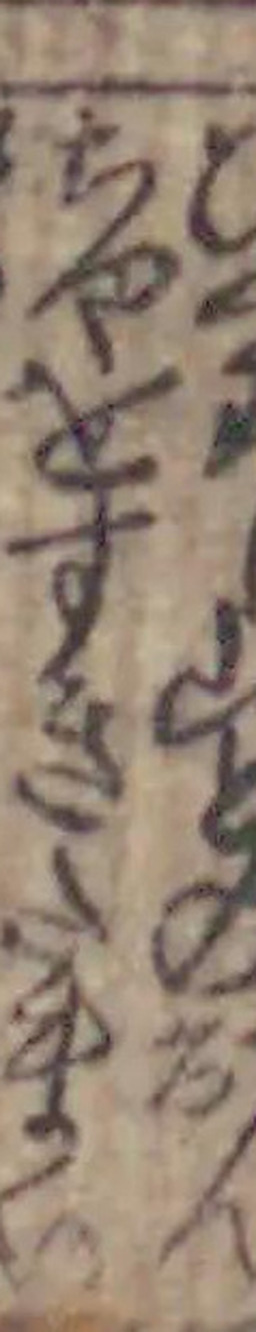ちやをすきたまい
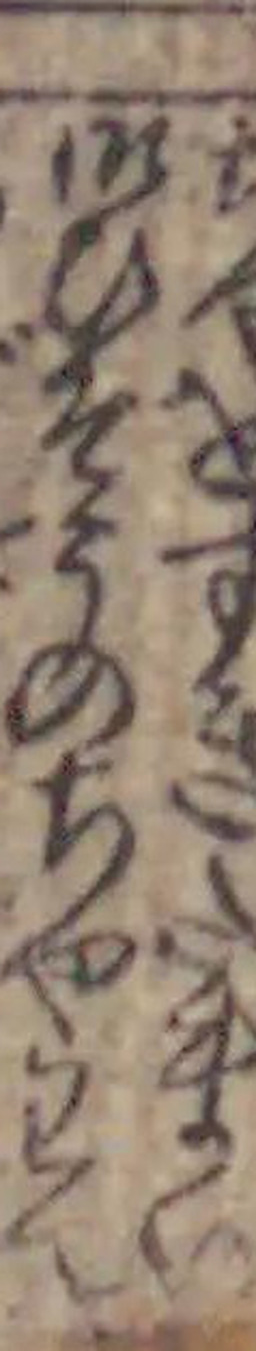御ひそうのちやわん
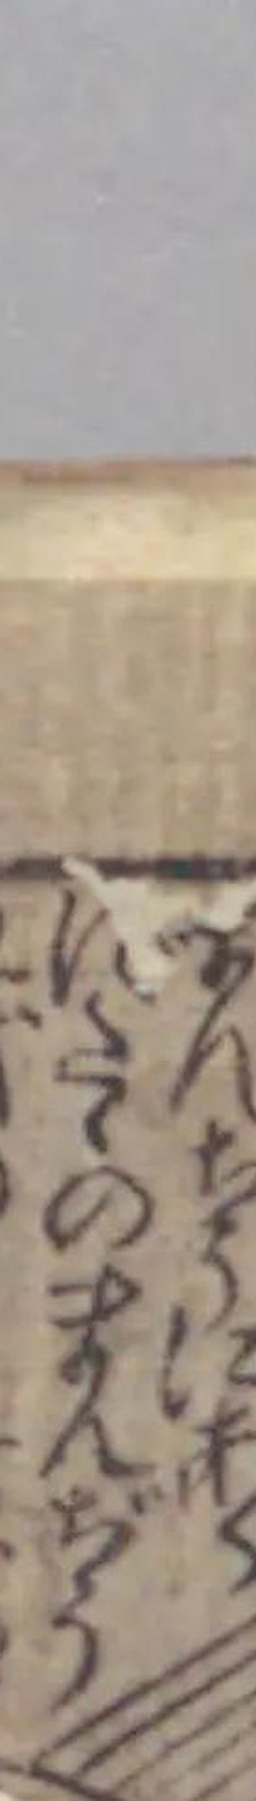ずたゝのまんぢう
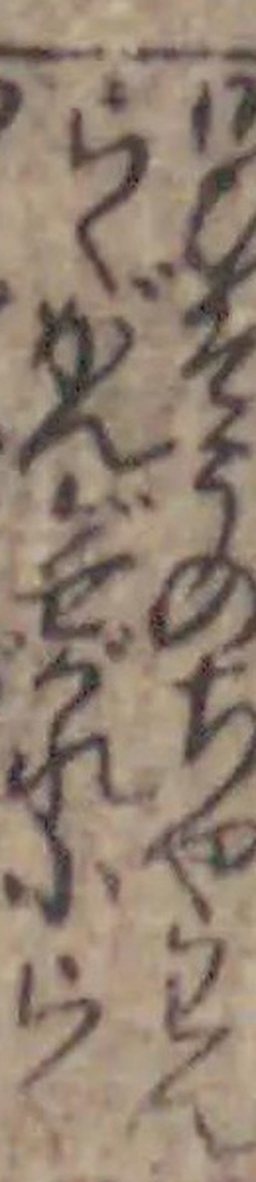らくがんがせがれ小らく
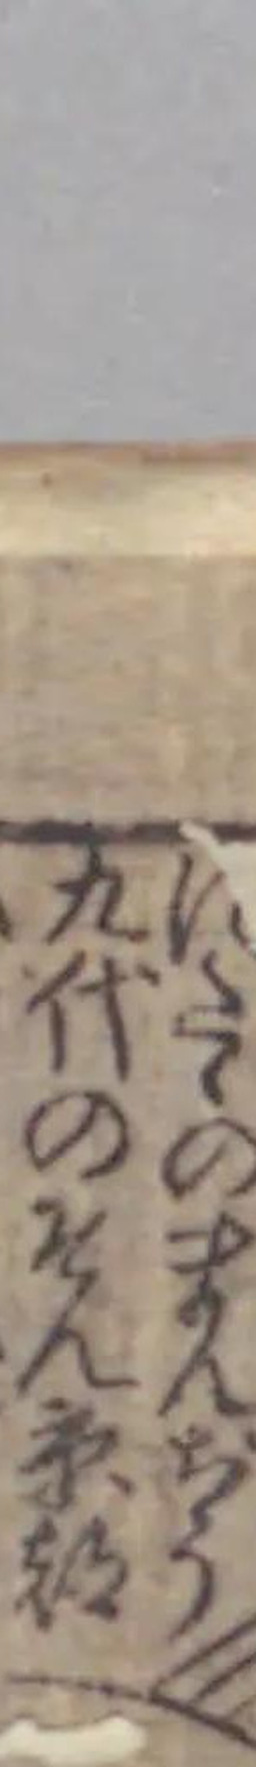九代のそん京都
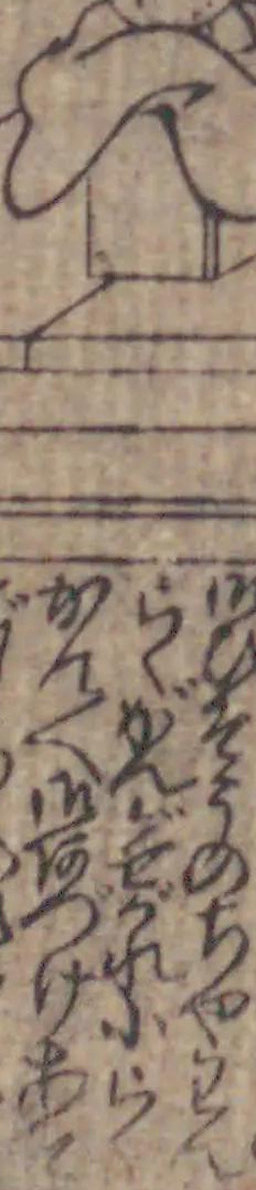かんへ御あづけあそ
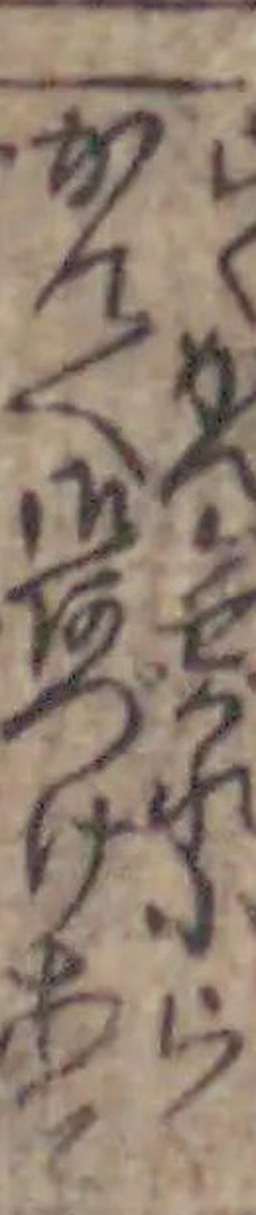かんへ御あづけあそ
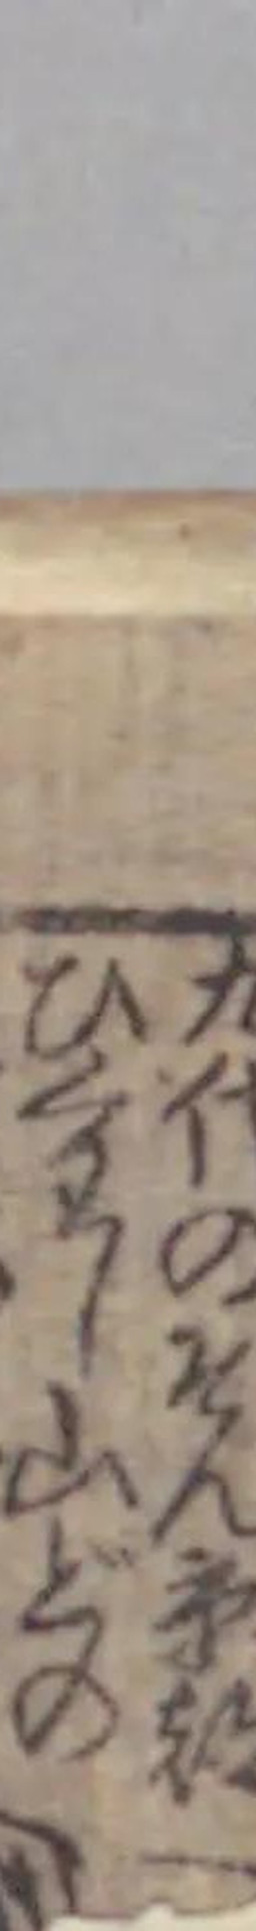ひくわし山どの
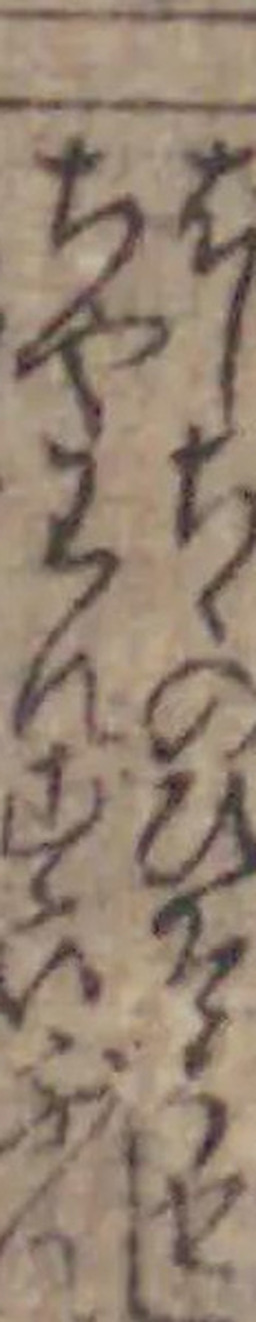ちやわんずいぶん
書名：名代干菓子山殿 3巻
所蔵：国立国会図書館 National Diet Library, JAPAN
